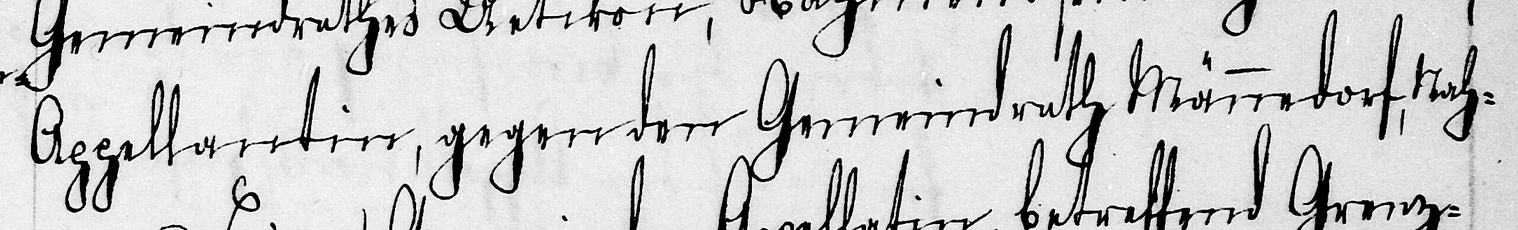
Appellantin, gegen den Gemeindrath Männedorf, Nah¬
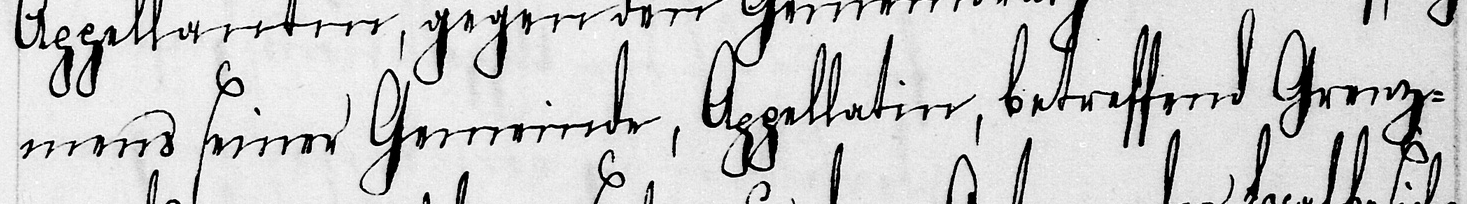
mens seiner Gemeinde, Appellatin, betreffend Grenz¬
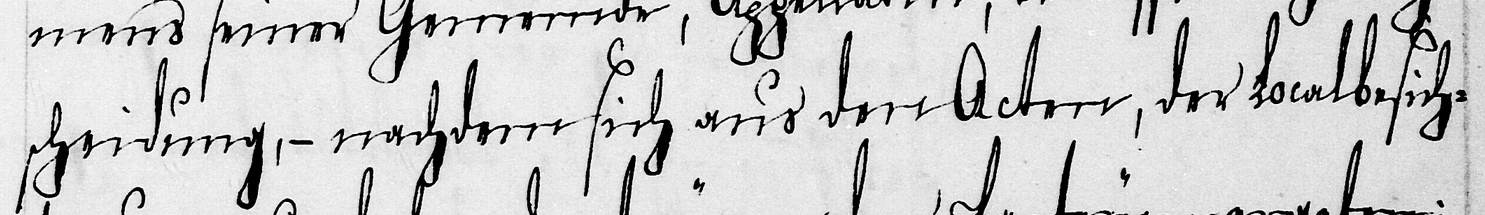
scheidung, – nachdem sich aus den Acten, der Localbesich¬
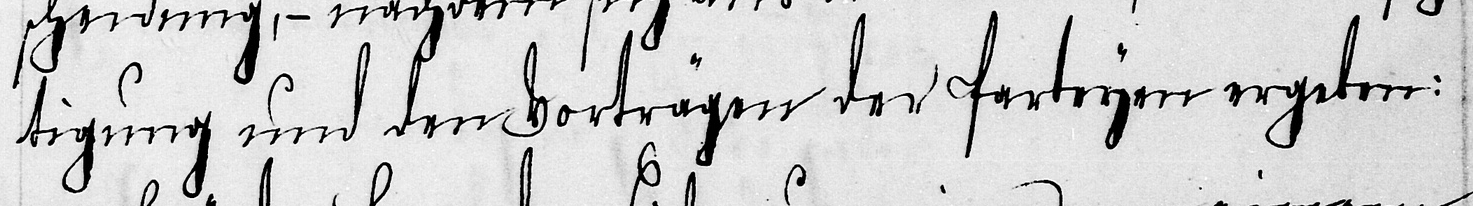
tigung und den Vorträgen der Parteyen ergeben:
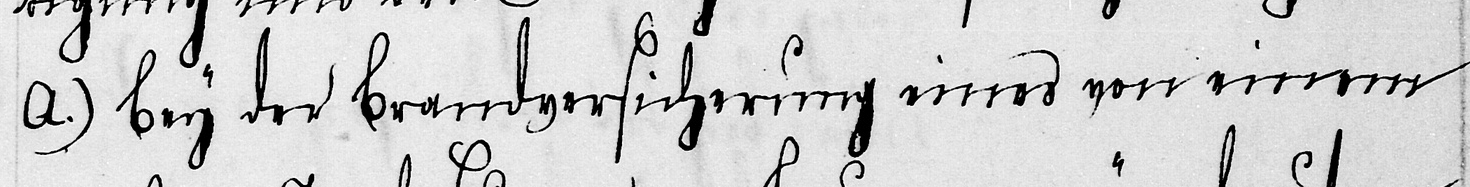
A.) Bey der Brandversicherung eines von einem
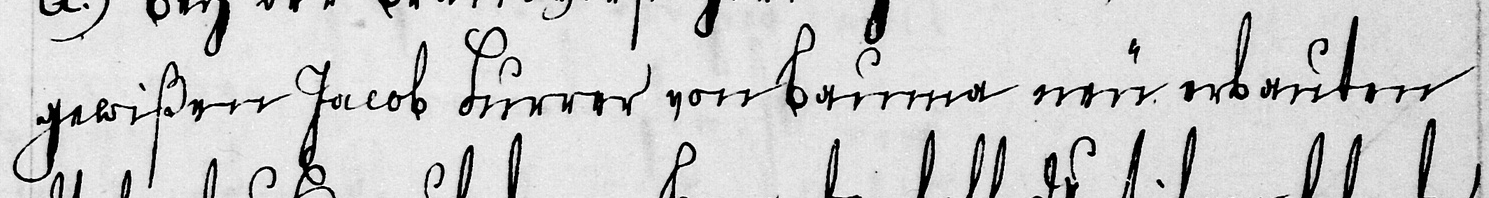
gewißen Jacob Furrer von Bauma neu erbauten
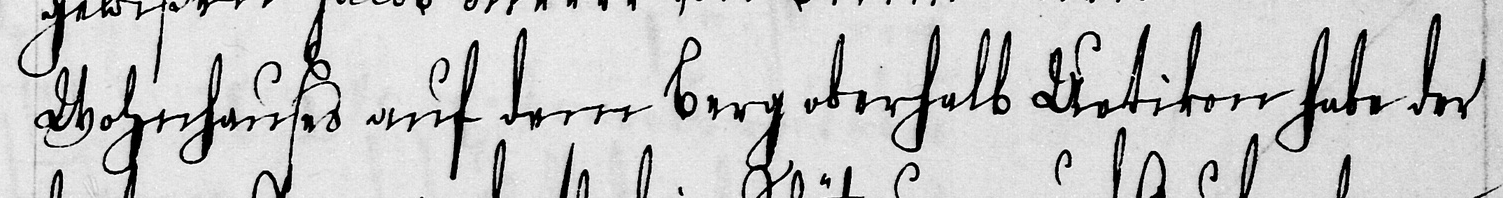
Wohnhauses auf dem Berg oberhalb Uetikon habe der
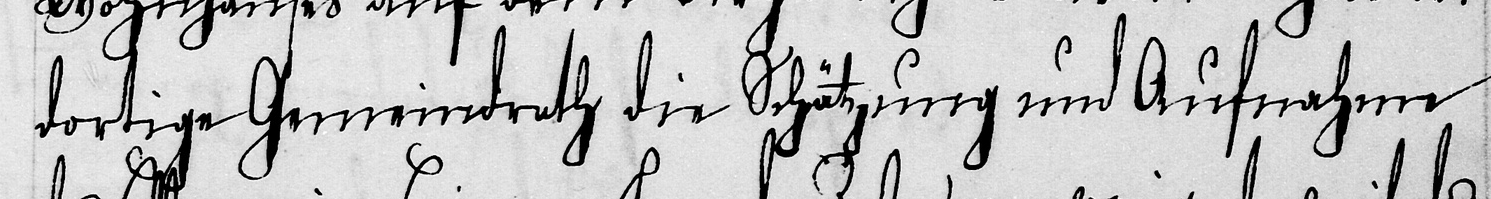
dortige Gemeindrath die Schätzung und Aufnahme
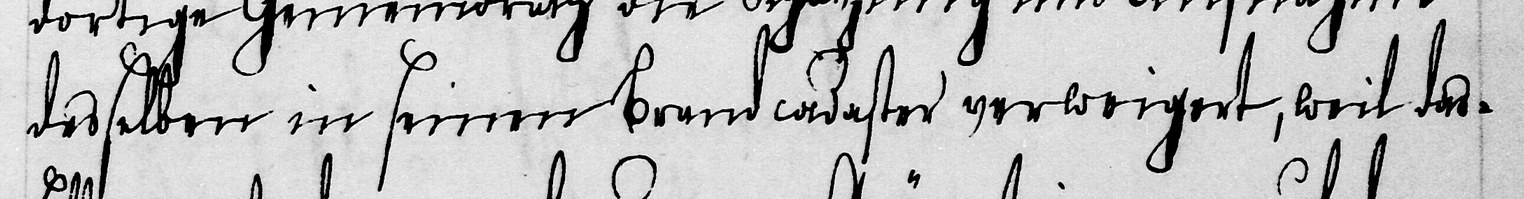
desselben in seinen Brandcadaster verweigert, weil das¬
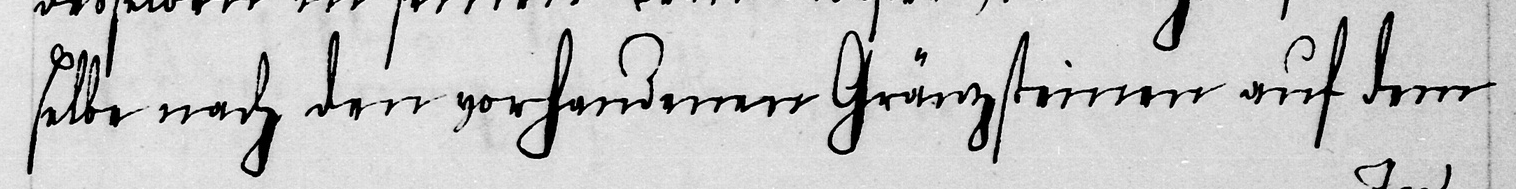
selbe nach den vorhandenen Gränzsteinen auf dem
